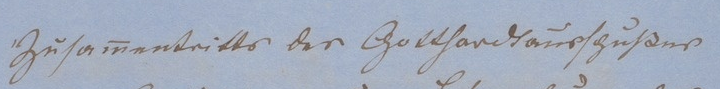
Zusammentritts des Gotthardtausschußes
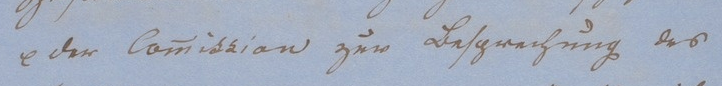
& der Commission zur Besprechung des
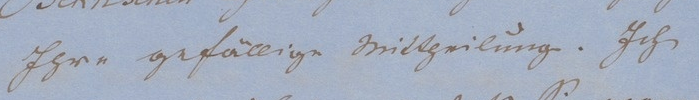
Ihre gefällige Mittheilung. Ich
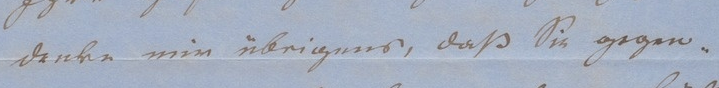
denke mir übrigens, daß Sie gegen-
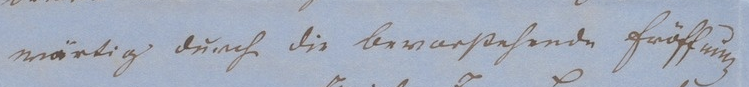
wärtig durch die bevorstehende Eröffnung
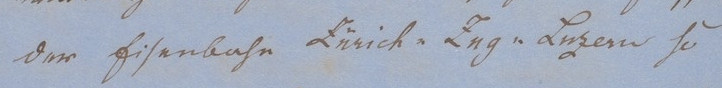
der Eisenbahn Zürich–Zug–Luzern so
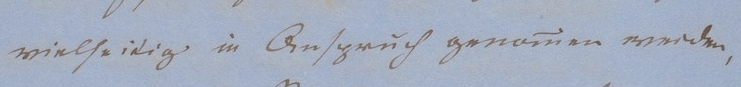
vielseitig in Anspruch genommen werden,
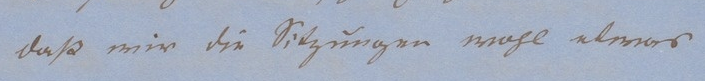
daß wir die Sitzungen wohl etwas
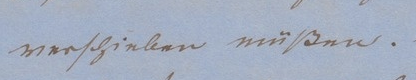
verschieben müßen. –
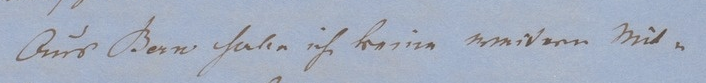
Aus Bern habe ich keine weitern Mit-
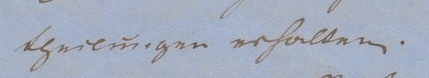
theilungen erhalten.
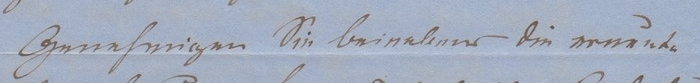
Genehmigen Sie beinebens die erneute
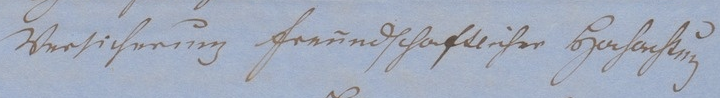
Versicherung freundschaftlicher Hochachtung
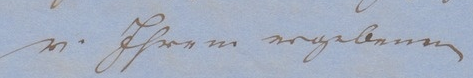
v. Ihrem ergebenen
